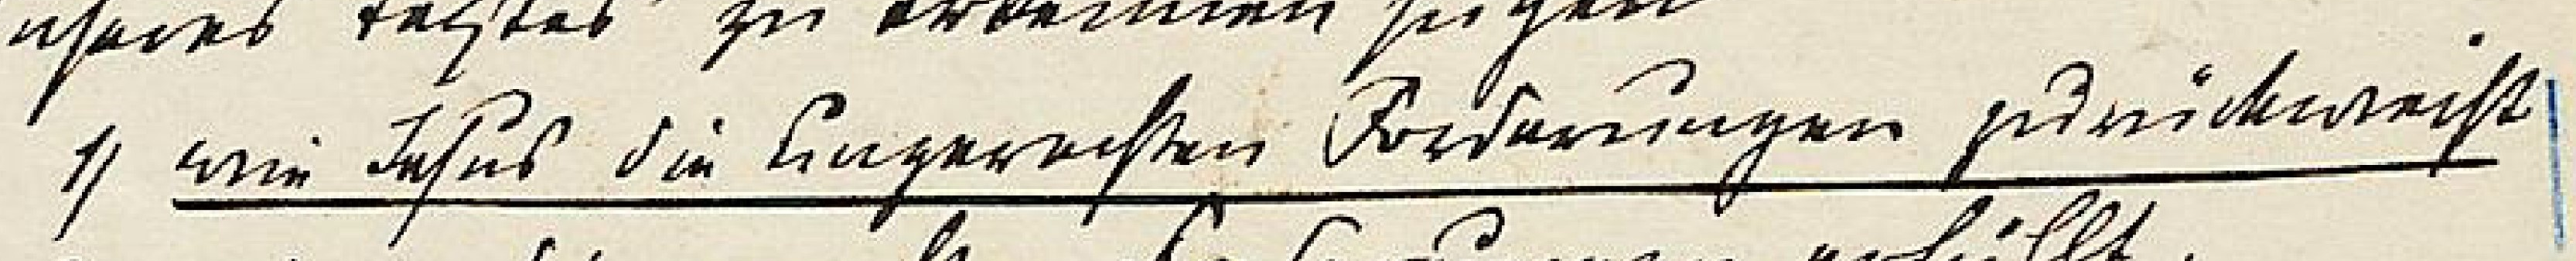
1) wie Jesus die ungerechten Forderungen zurückweist
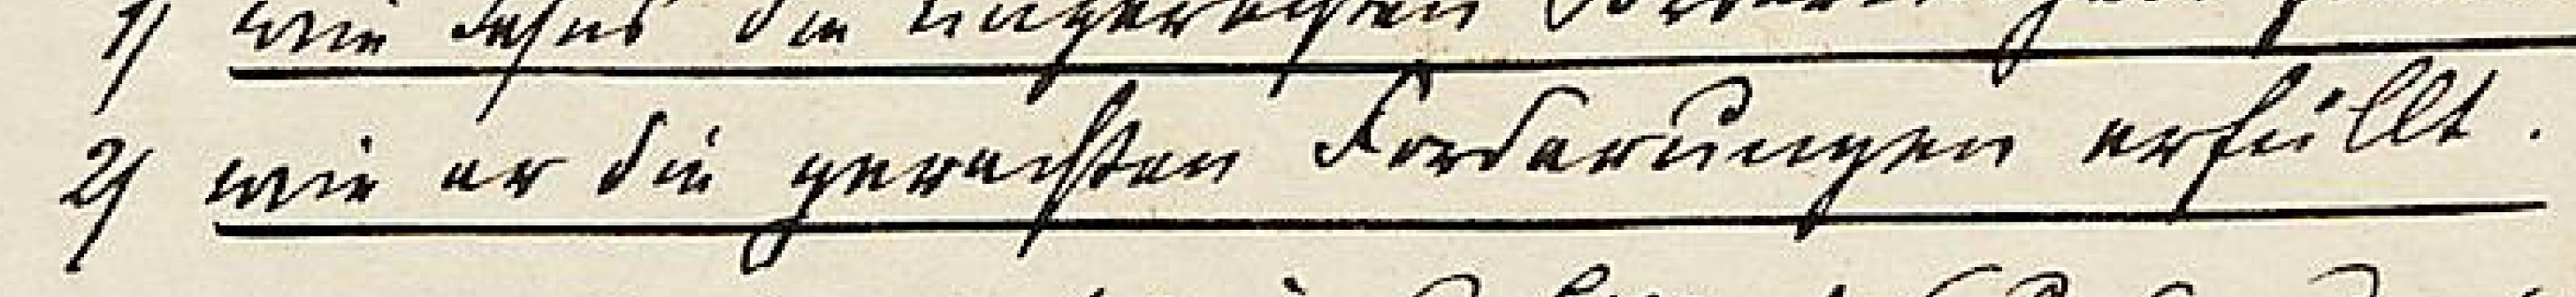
2) wie er die gerechten Forderungen erfüllt.
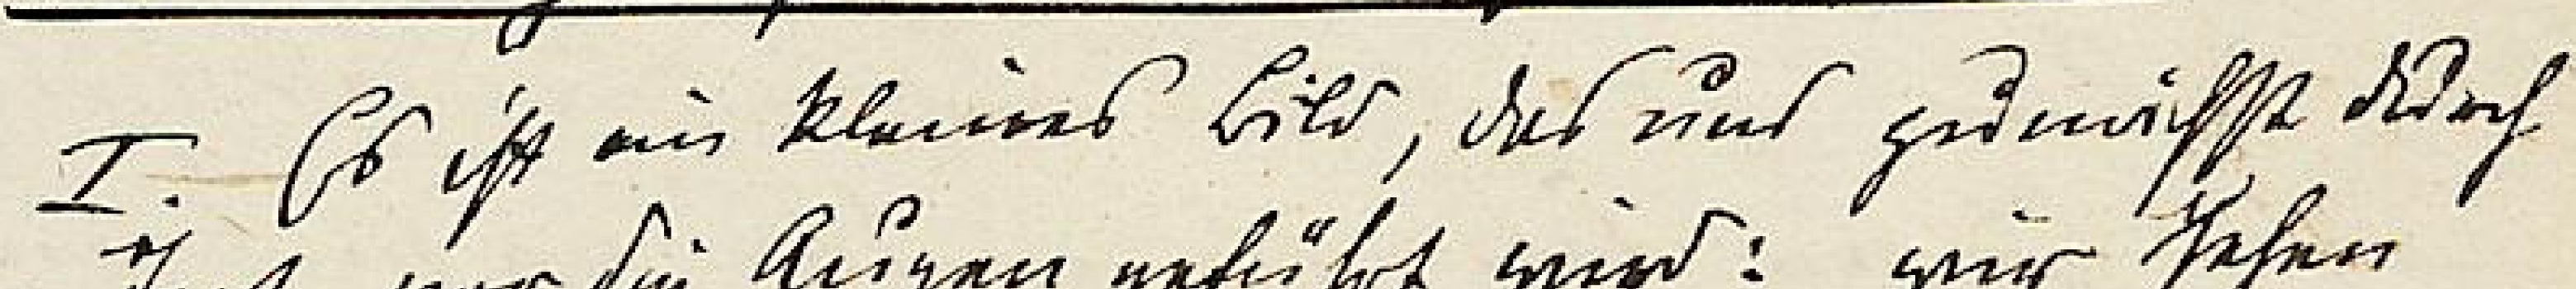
I. Es ist ein kleines Bild, das und zunächst durch
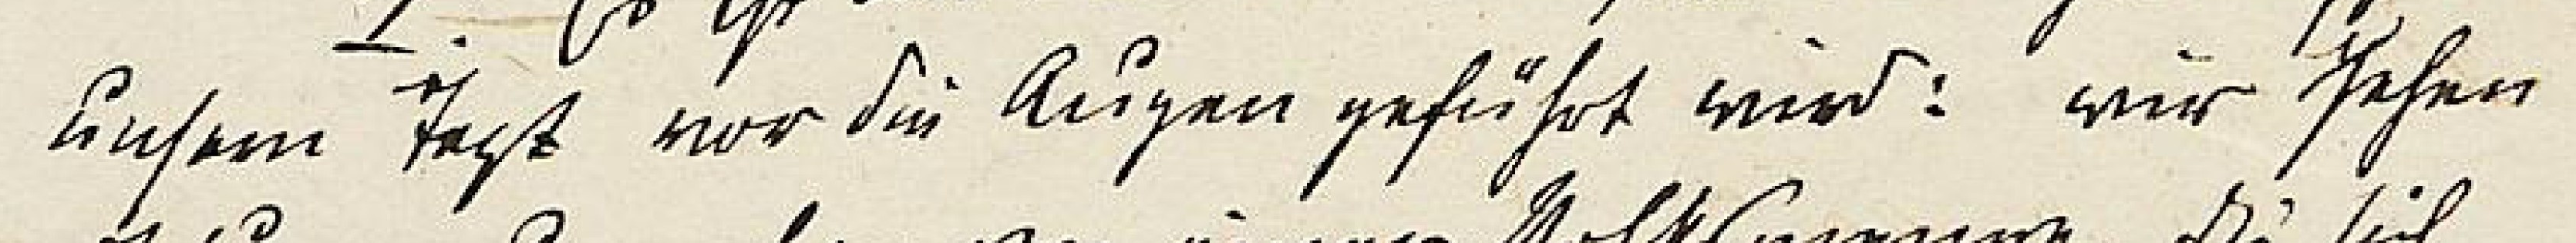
unsern Text vor die Augen geführt wird: wir sehen
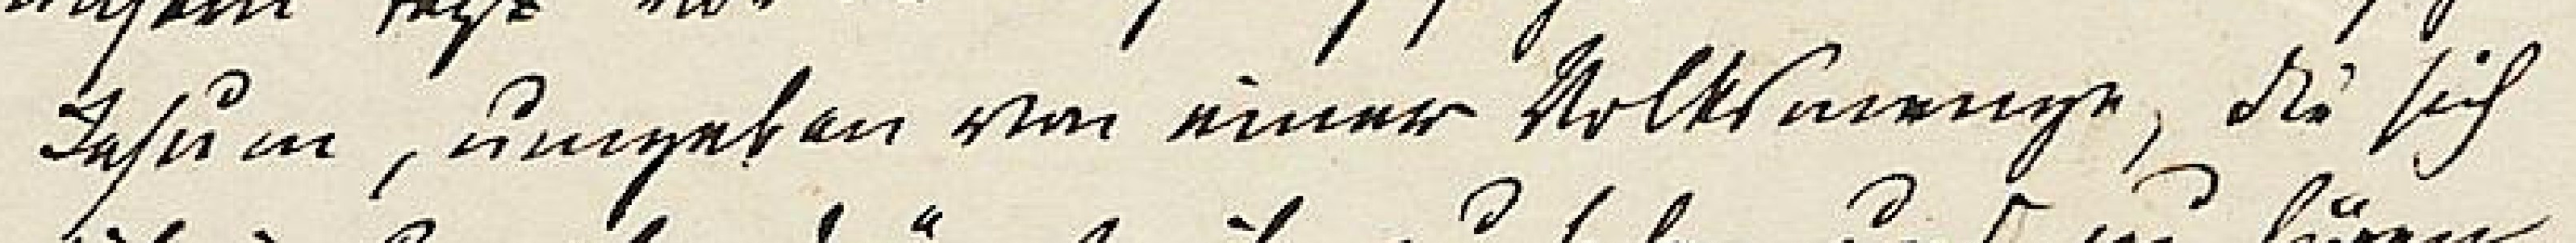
Jesum, umgeben von einer Volksmenge, die sich
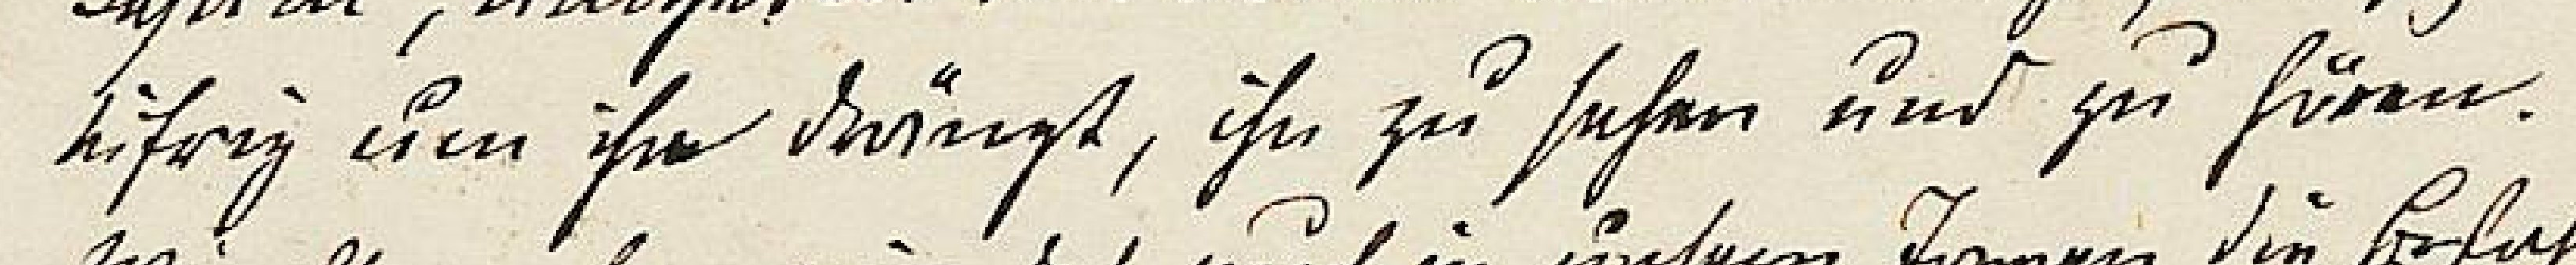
eifrig um ihn, ihn zu sehen und zu hören.
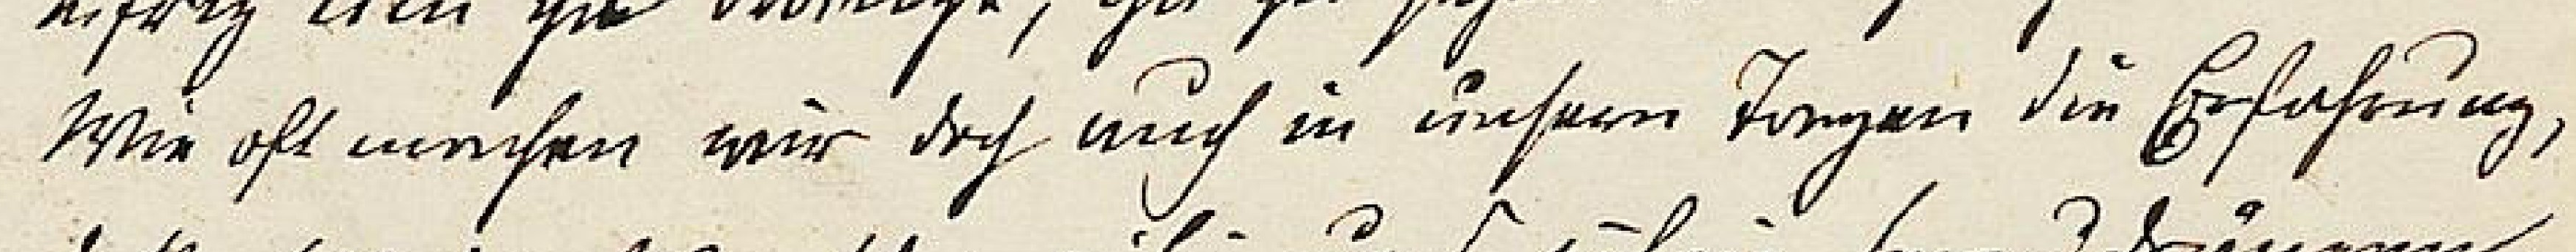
Wie oft machen wir doch auch in unsern Tagen die Erfahrung,
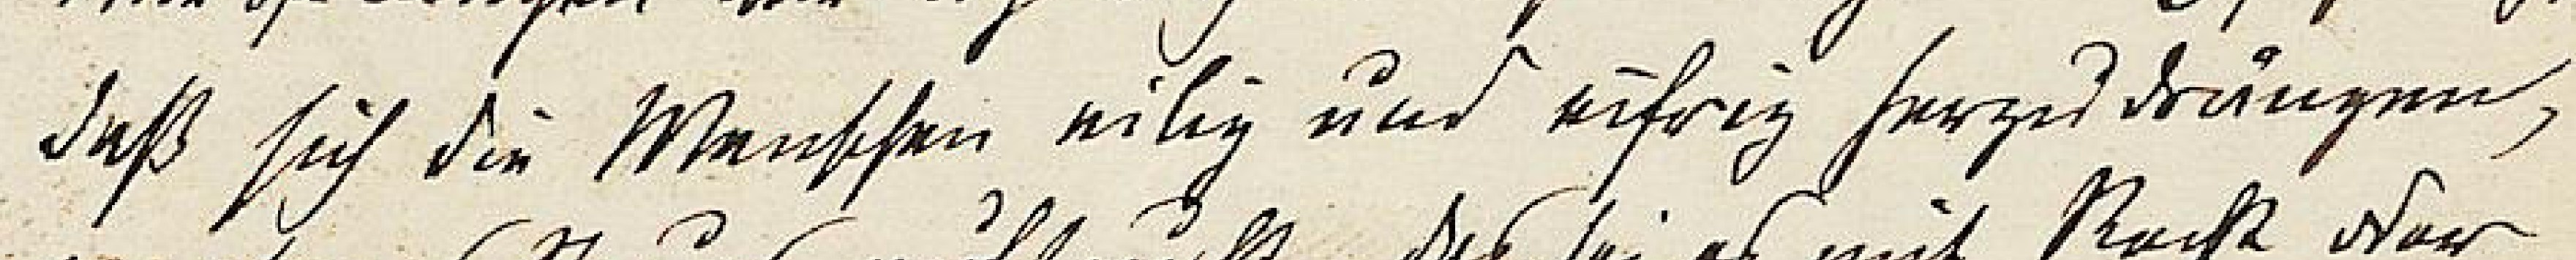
daß sich die Menschen eilig und eifrig herzudrängen,
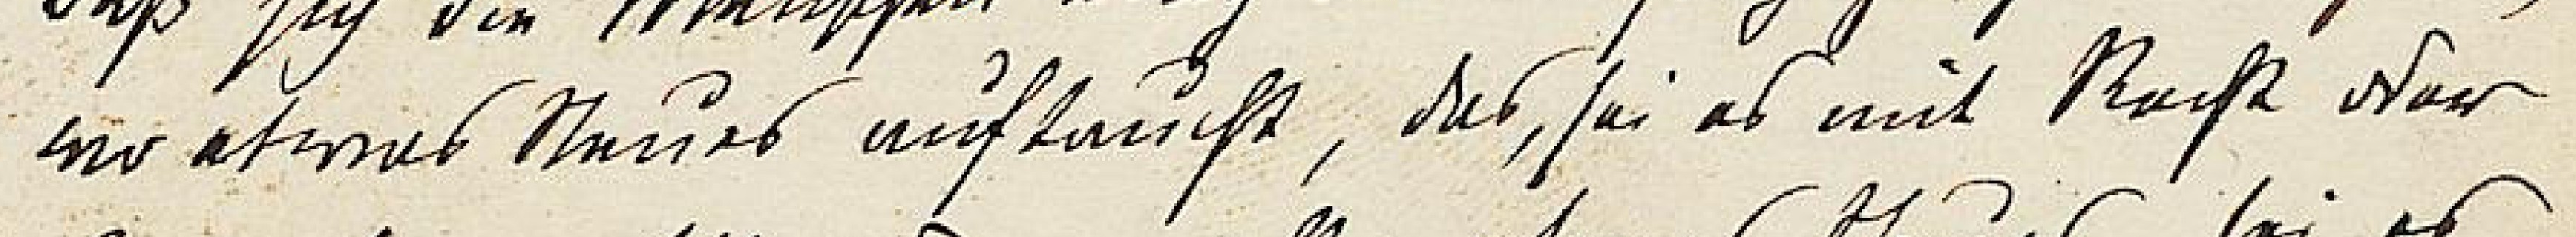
wo etwas Neues auftaucht, das, sei es mit Recht oder
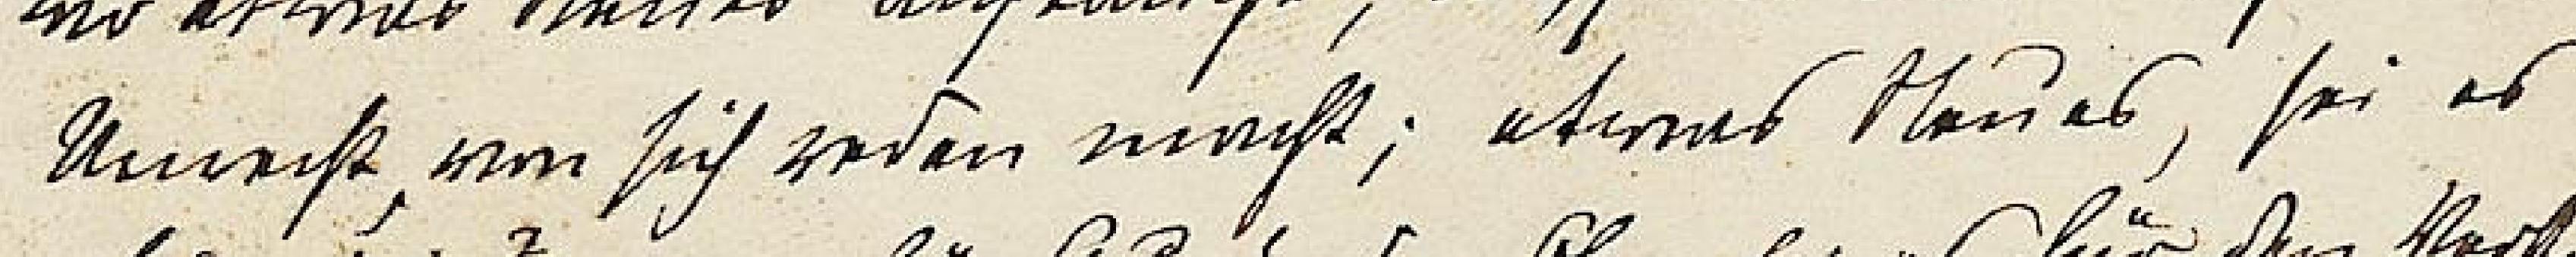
Unrecht, von sich reden macht, etwas Neues, sei es
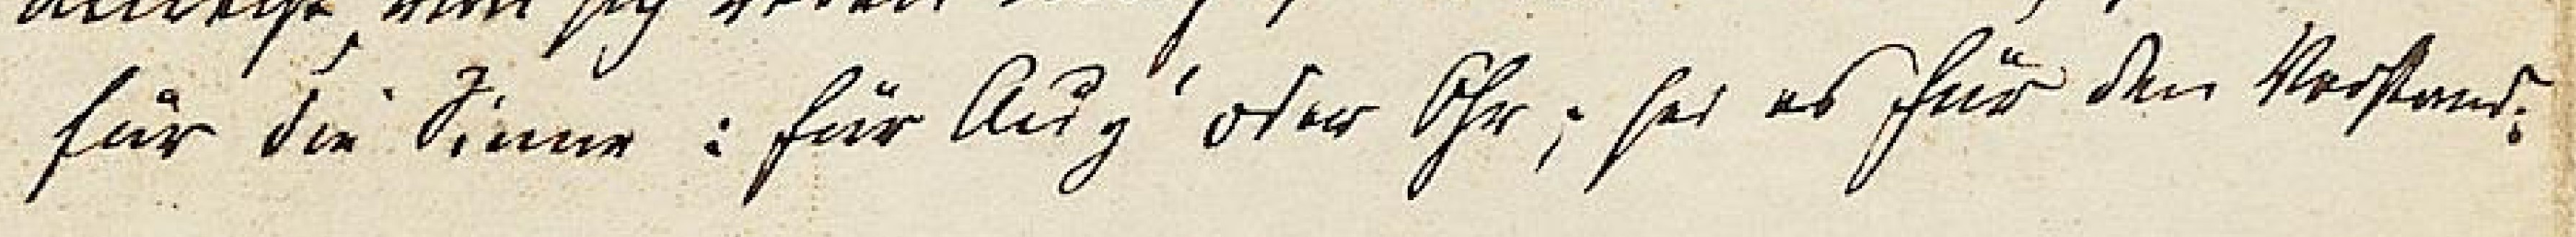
für die Sinne: für Aug' oder Ohr; sei es für den Verstand;
